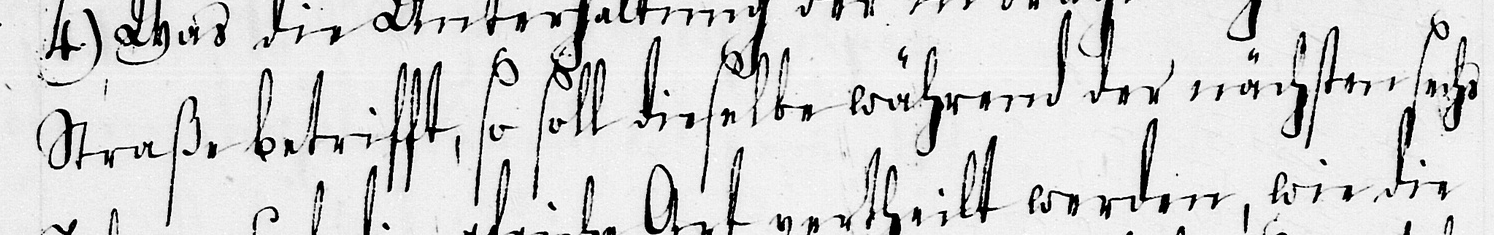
Straße betrifft, so soll dieselbe während der nächsten sec¬
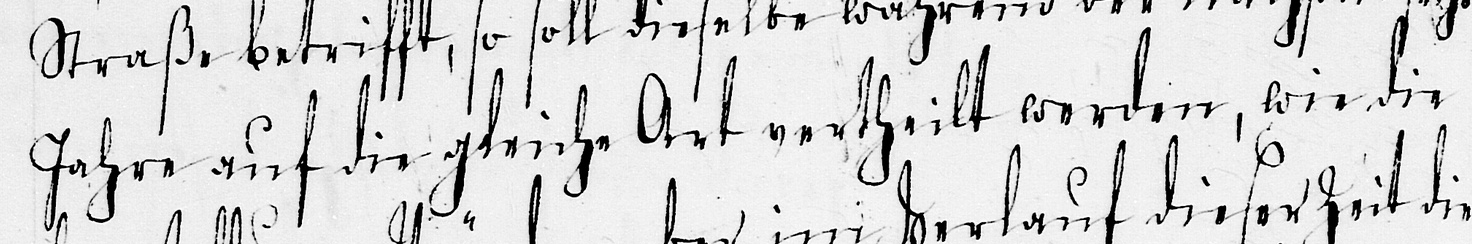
Jahre auf die gleiche Art vertheilt werden, wie die
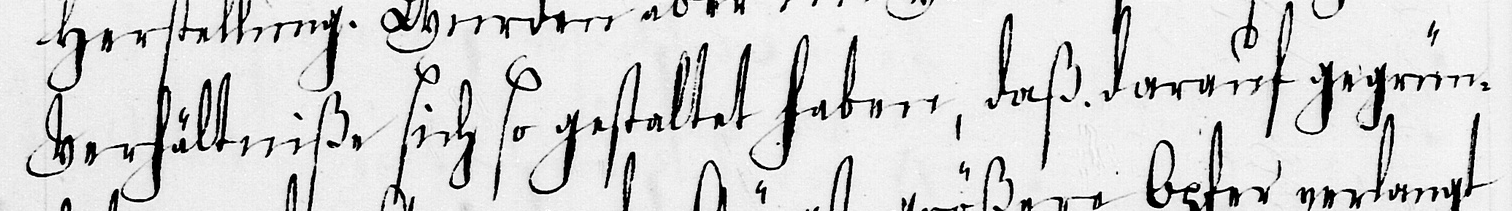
Verhältniße sich so gestaltet haben, daß darauf gegrün¬
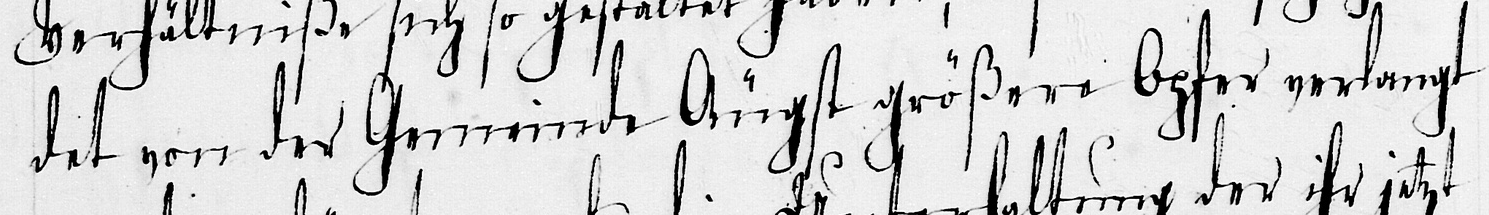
det von der Gemeinde Äugst größere Opfer verlangt
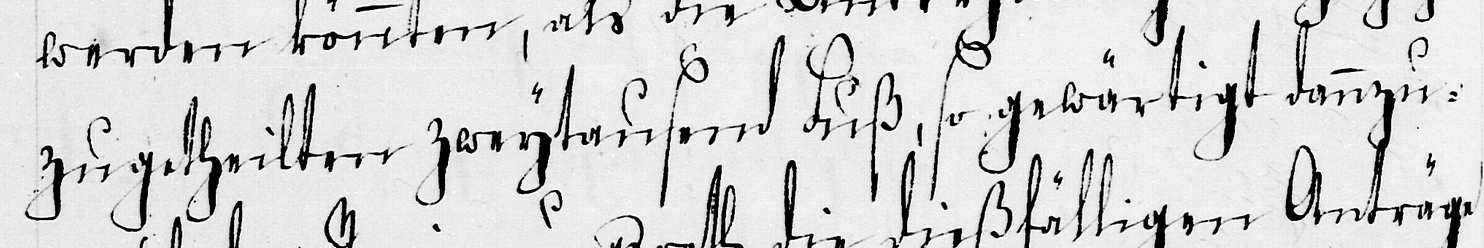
zugetheilten zweytausend Fuß, so gewärtigt dannzu¬
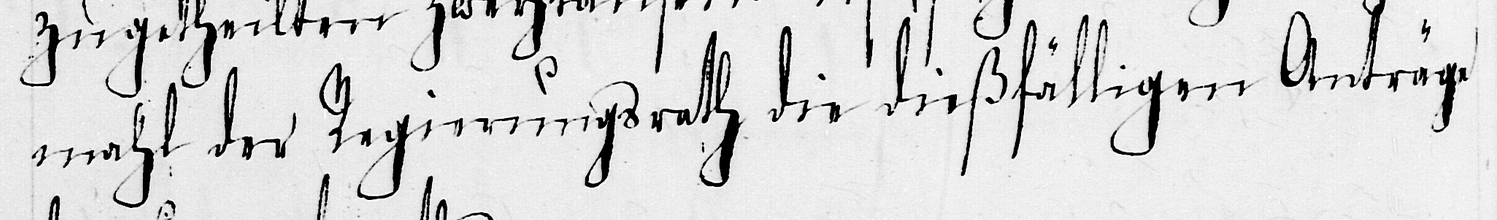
mahl der Regierungsrath die dießfälligen Anträge
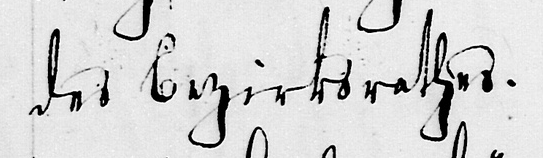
des Bezirksrathes.
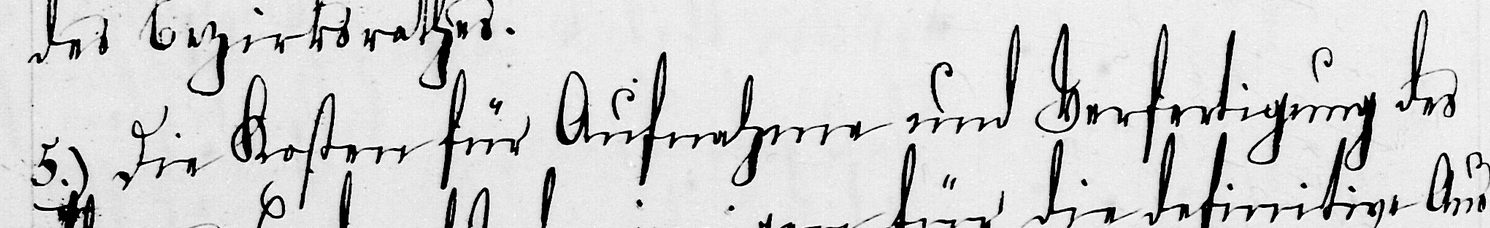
5.) Die Kosten für Aufnahme und Verfertigung des
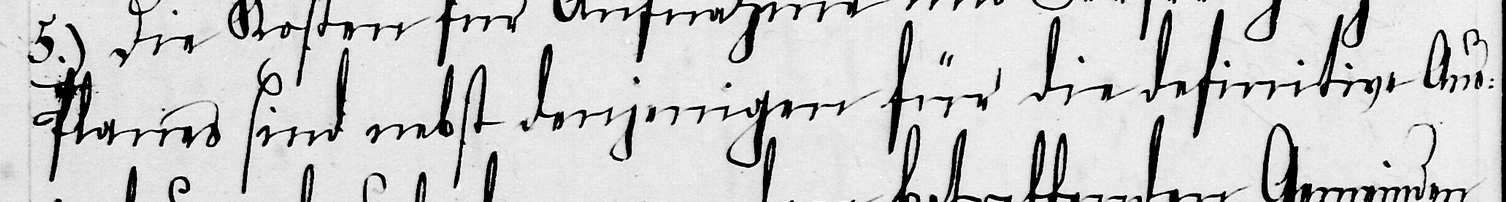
Planes sind nebst denjenigen für die definitive Aus¬
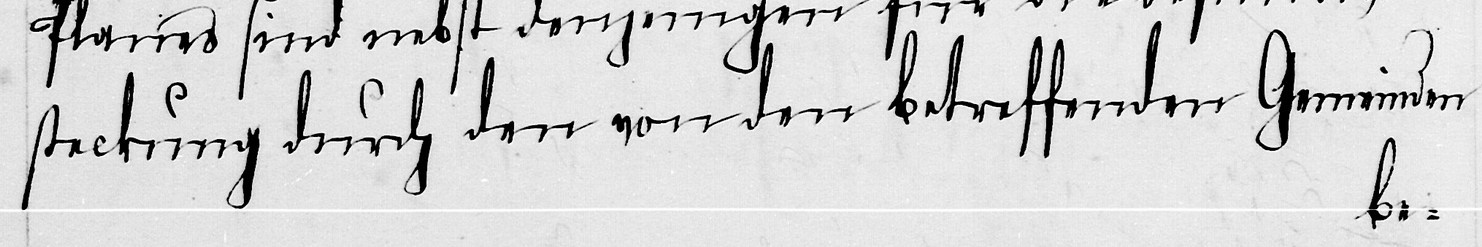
steckung durch den von den betreffenden Gemeinden
